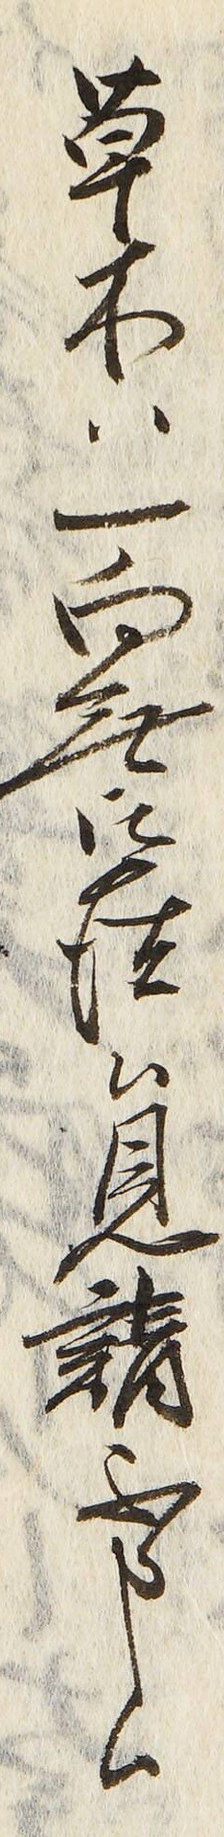草木は一向無御座候見請不申候
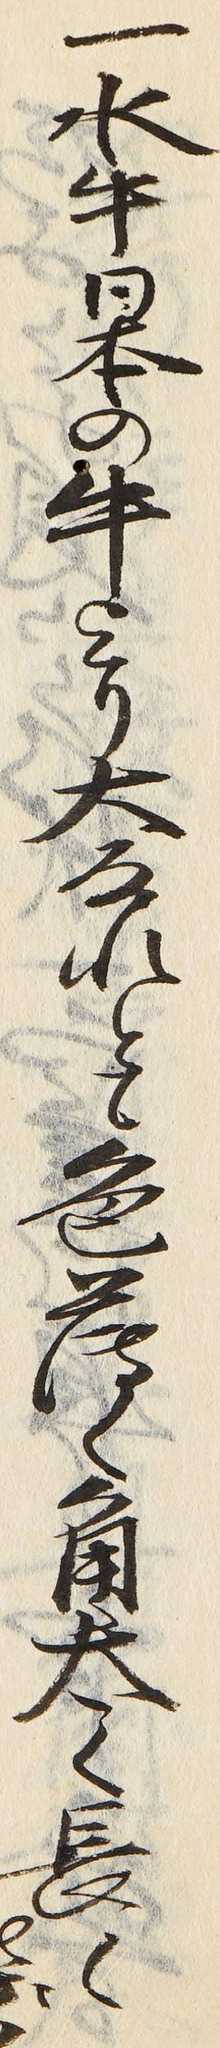一水牛日本の牛より大なれとも色薄く角太く長く
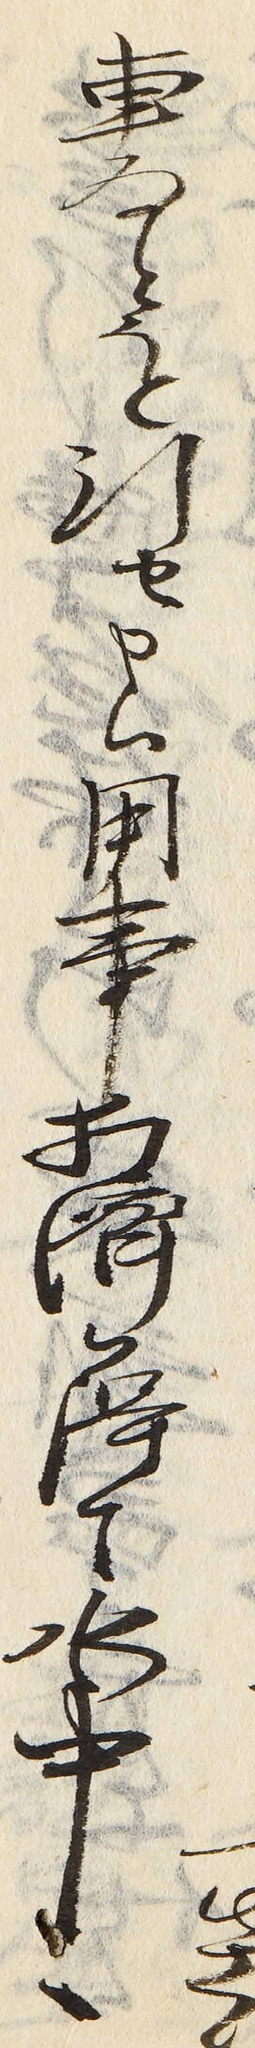車なとを引せ申候用事相済候得は水中へ
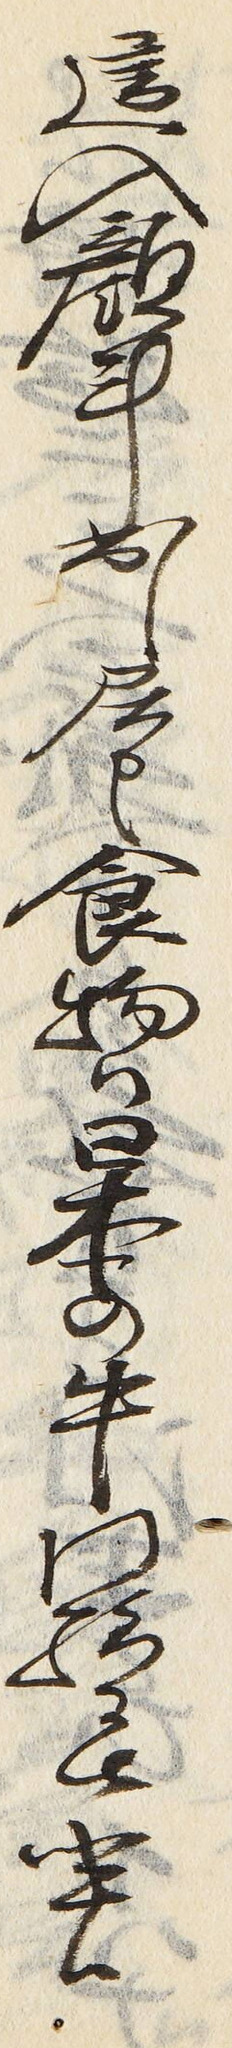這入顔斗出し居申候食物は日本の牛同様に御坐候
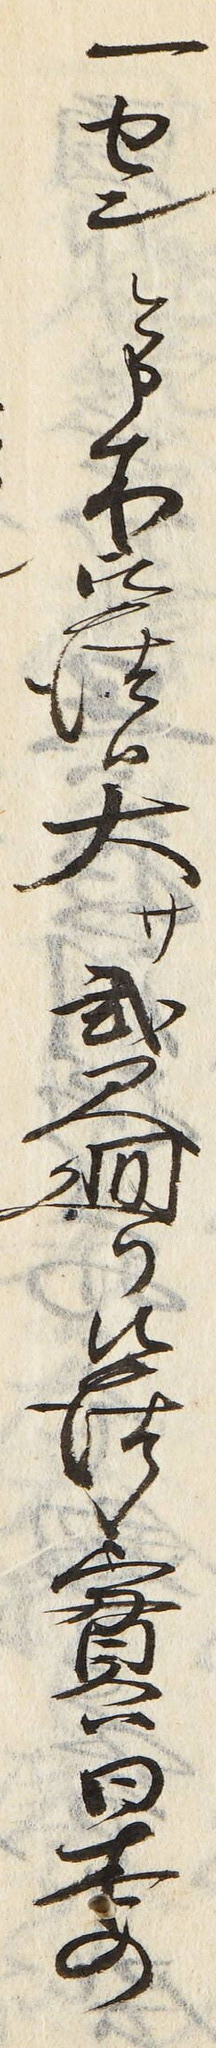一センと申木御座候大さ弐尺廻り御座候実は日本の
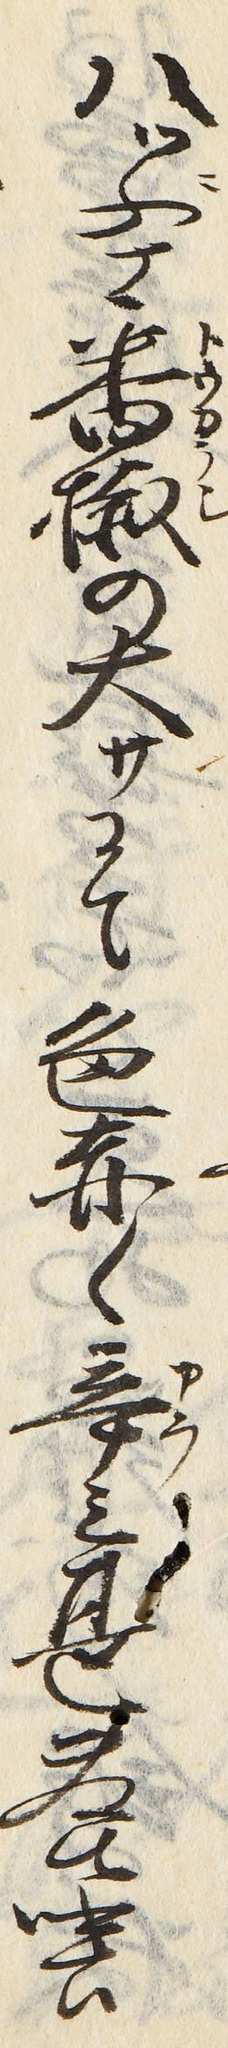八つぶさ番椒の大さにて色赤く辛み甚敷御坐候
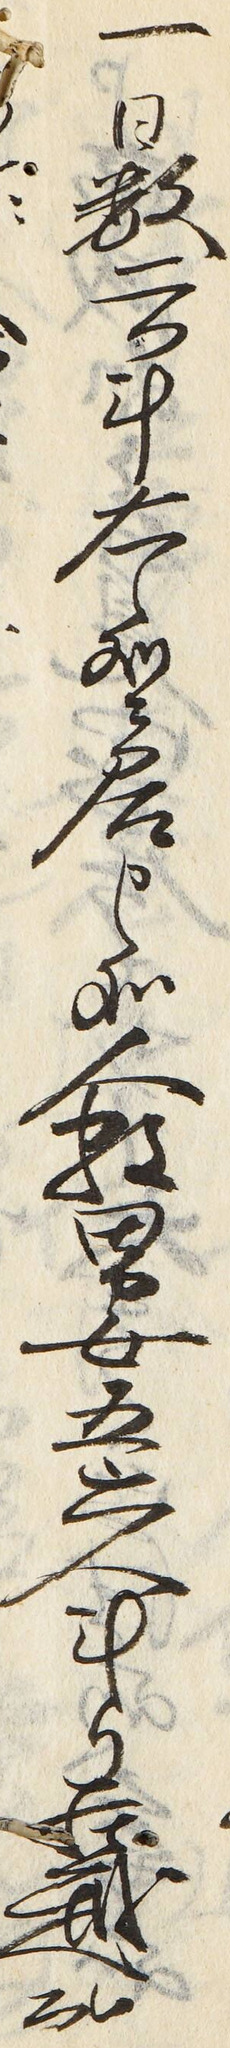一日数二日斗右之処に居申候処人数男女五六人斗り罷越候て
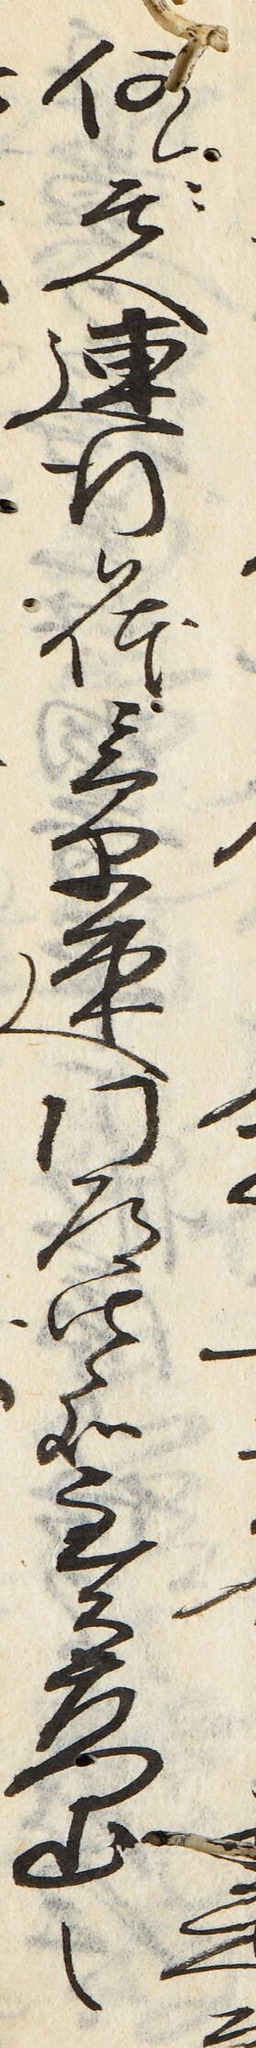何れにそへ連行候体にて早速同道仕候処至て高山之

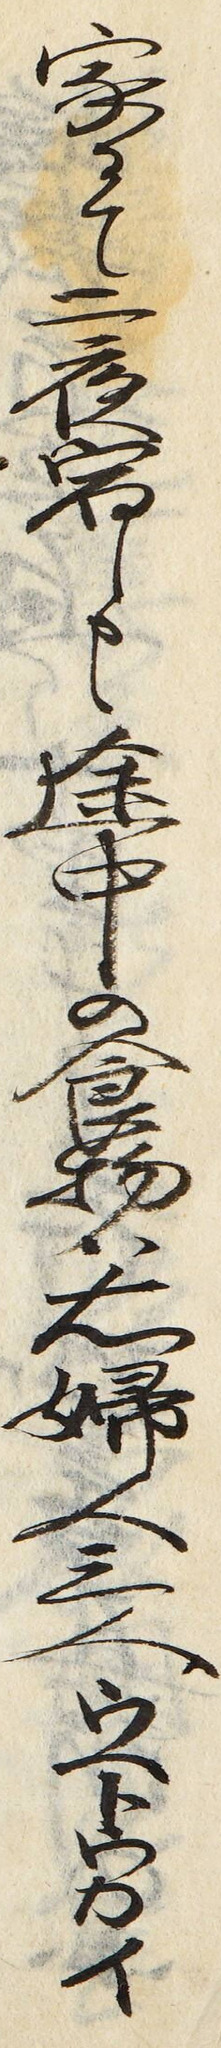家にて二夜宿し申候途中の食物は右婦人三人ウヘトウカイ
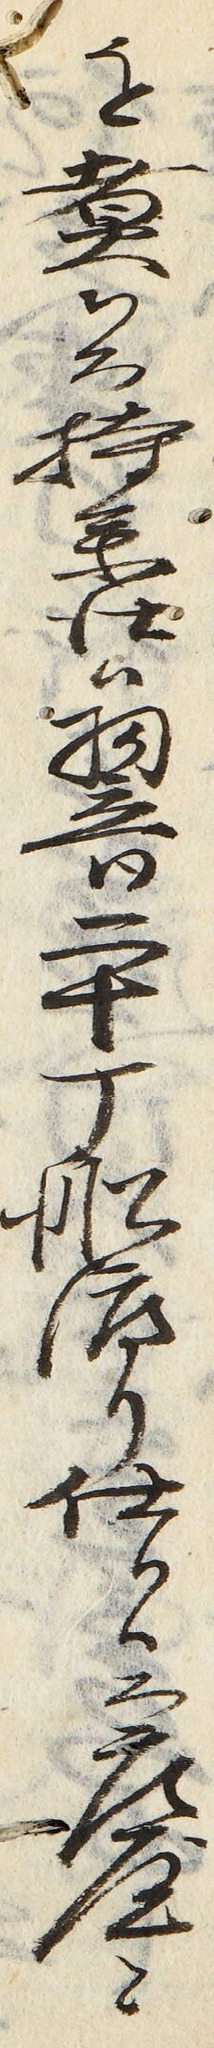を煮候て持参仕候翌日二十丁船渡り仕り候て庄屋と
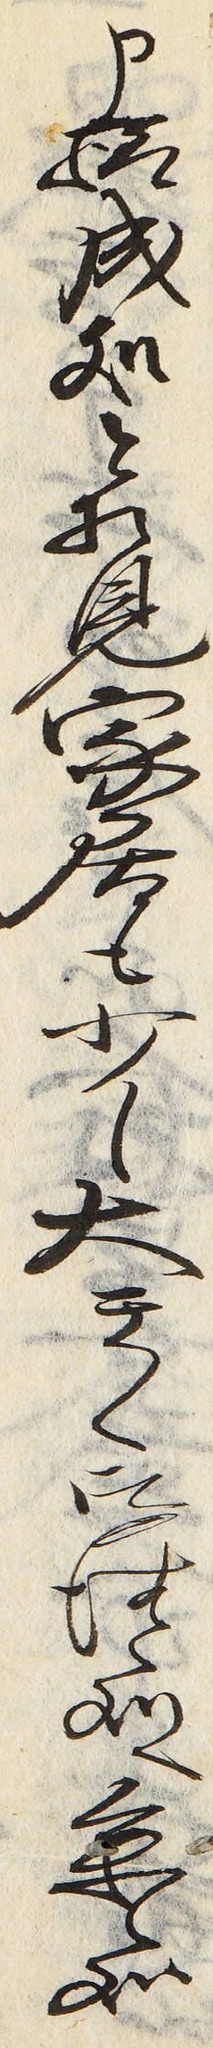申様成処と相見家居も少し大きく御座候処へ参候処
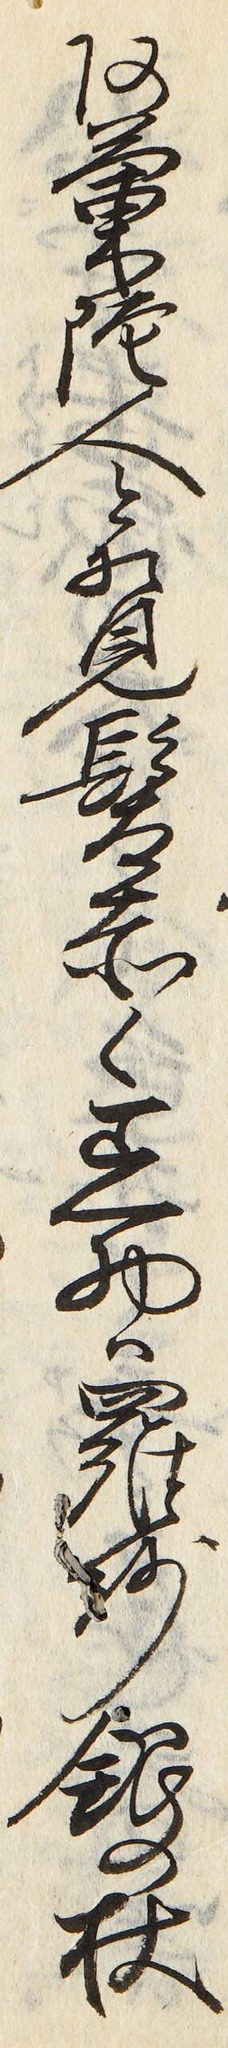阿蘭陀人と相見髪赤く着物は羅紗銀の杖
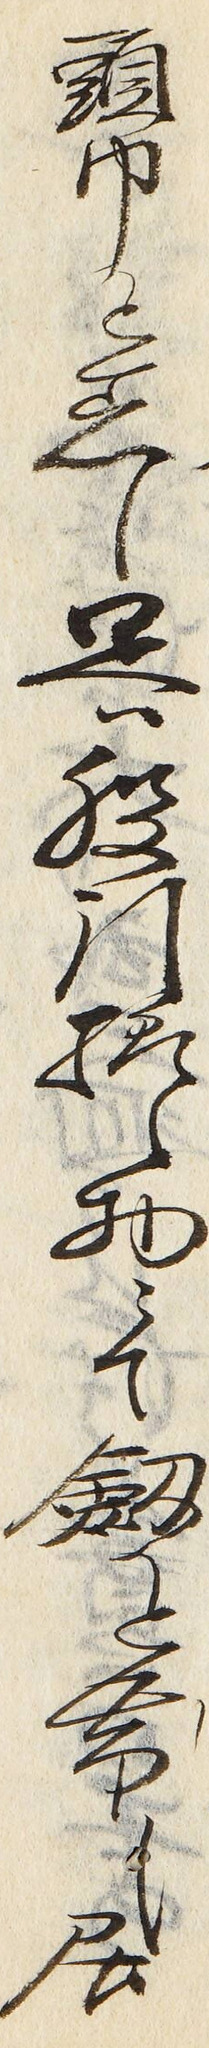頭巾を着し足は股引様之物にて剱を帯し居
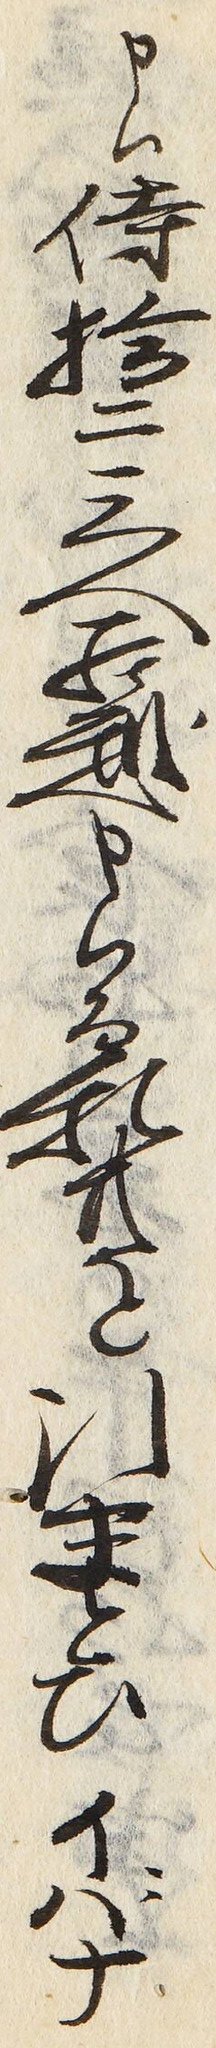申候侍拾二三人罷越申候て私共を引まとひイバナ
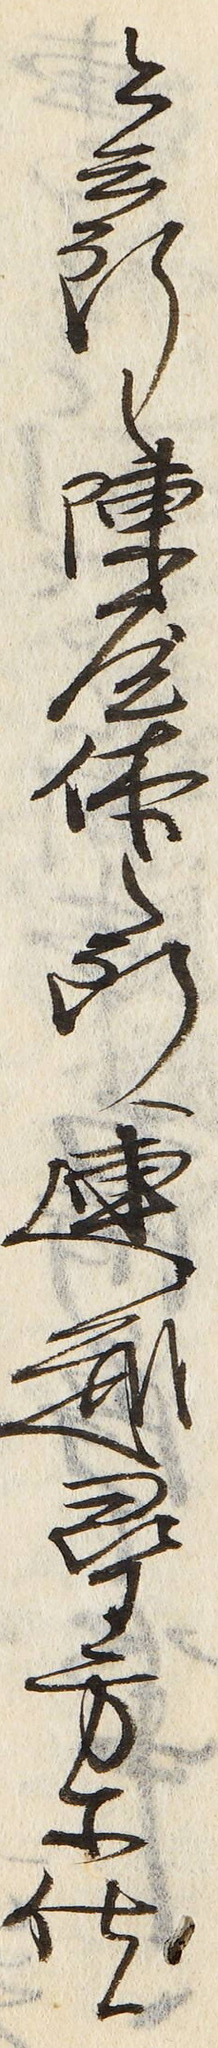と云所之陣屋体之所へ連越尋方等仕候
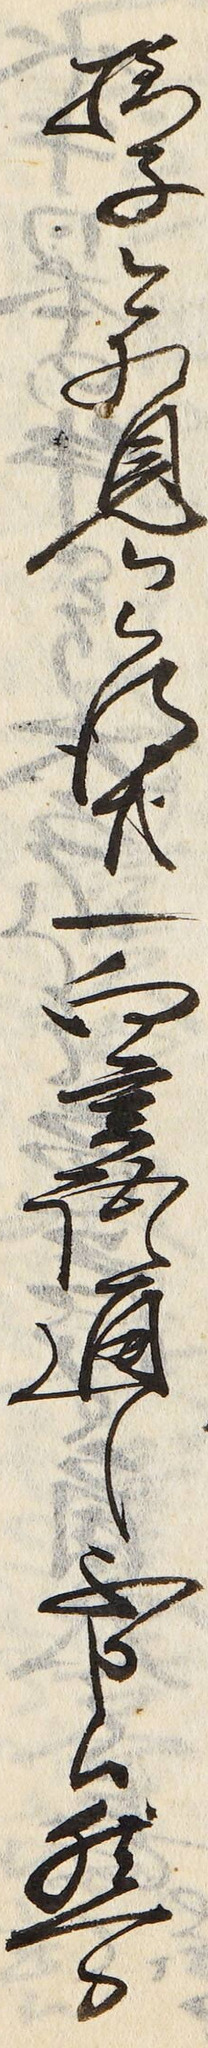様子と相見え候得共一向言語通し不申候然る
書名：漂流記
